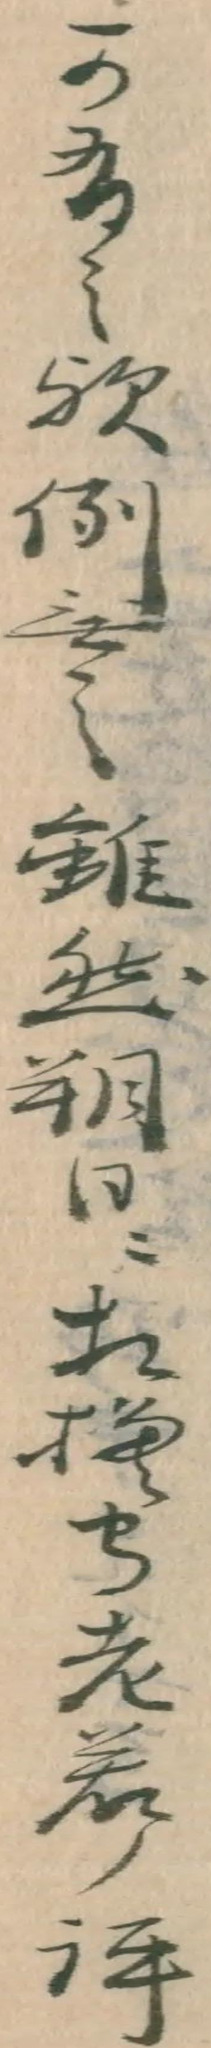可有之歟例無之雖然朔日ニ相模守老若ノ評
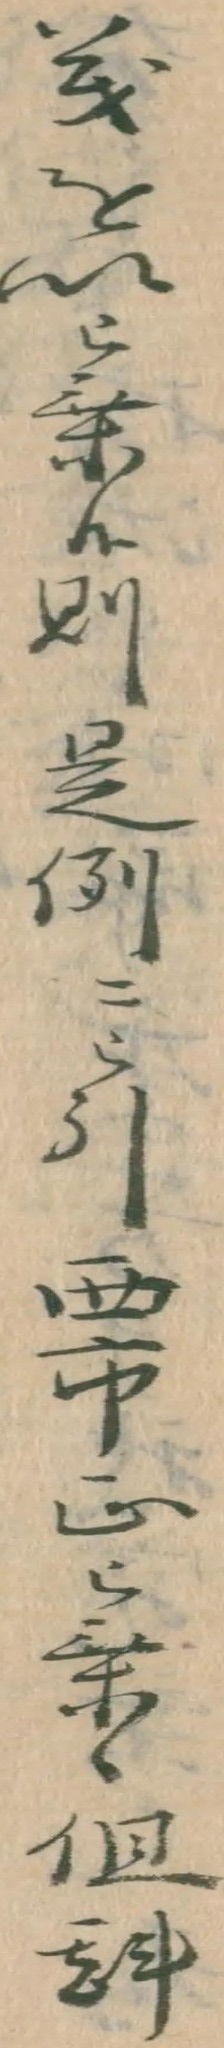義を以被乗候則是例ニ被引西市正被乗候但斟
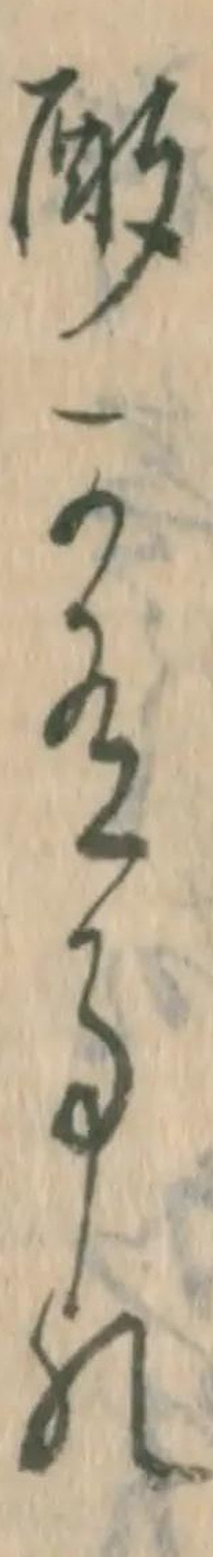酌可有事歟
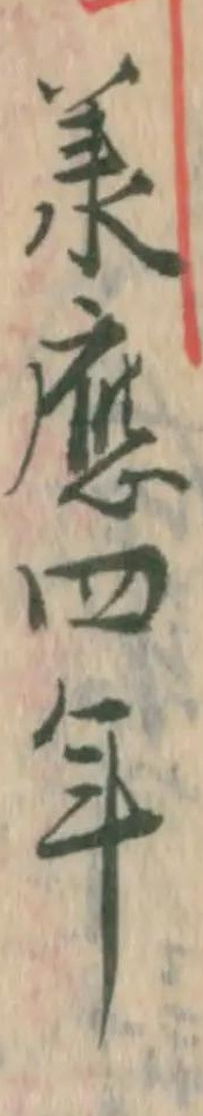承応二年
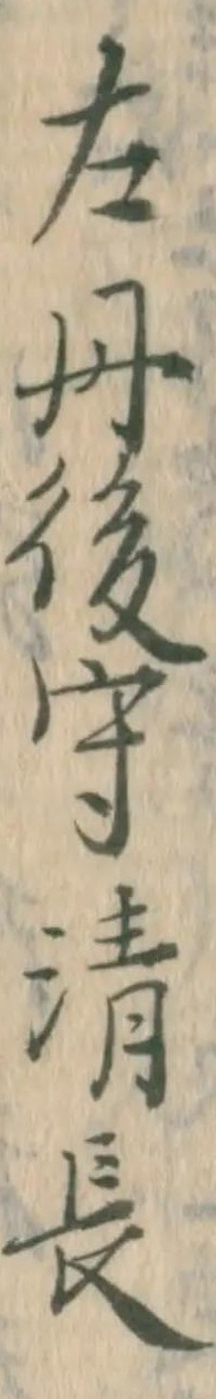左丹後守清長
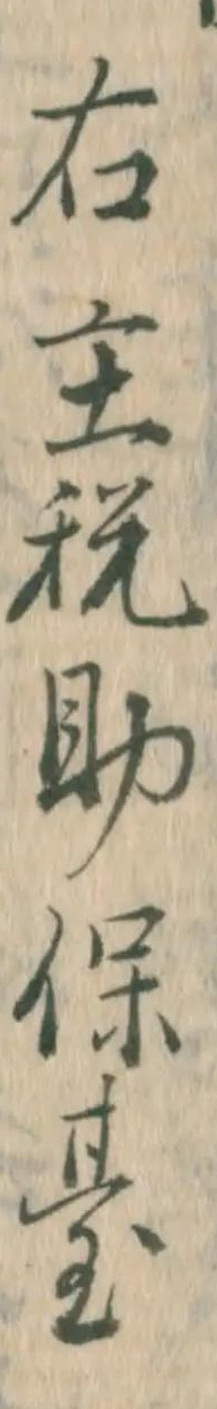右主税助保台
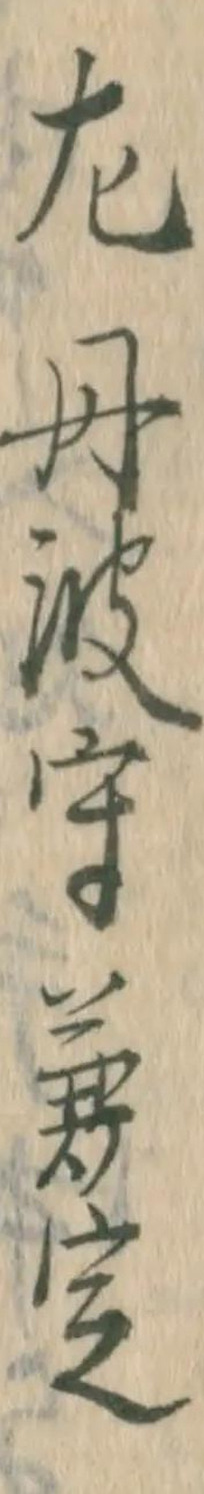左丹波守兼定
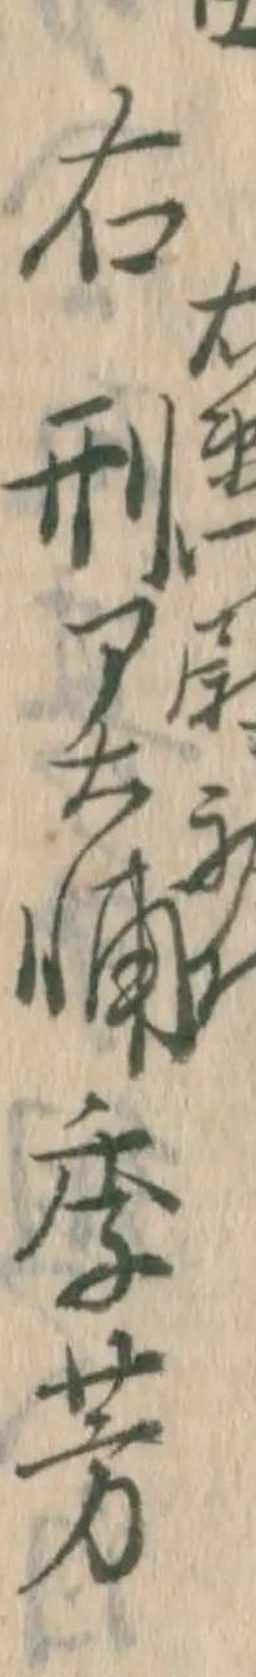右刑部大輔季芳
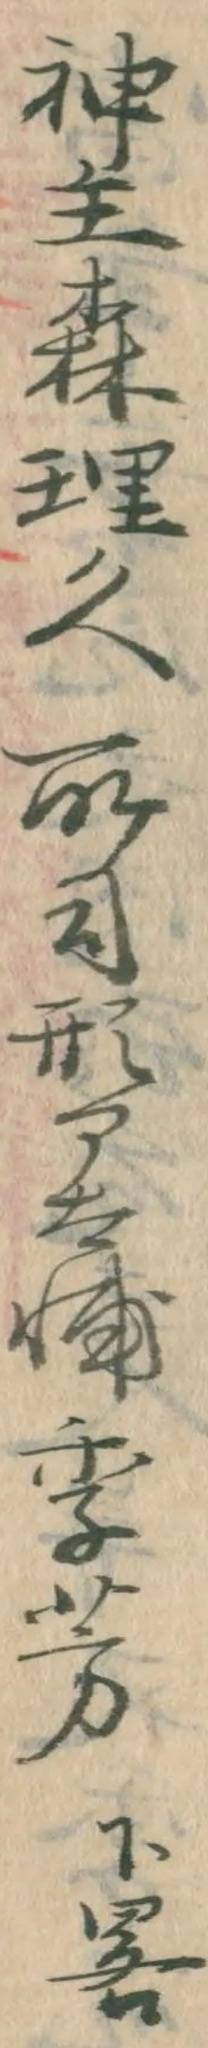神主森理久所司形部太輔季芳下略
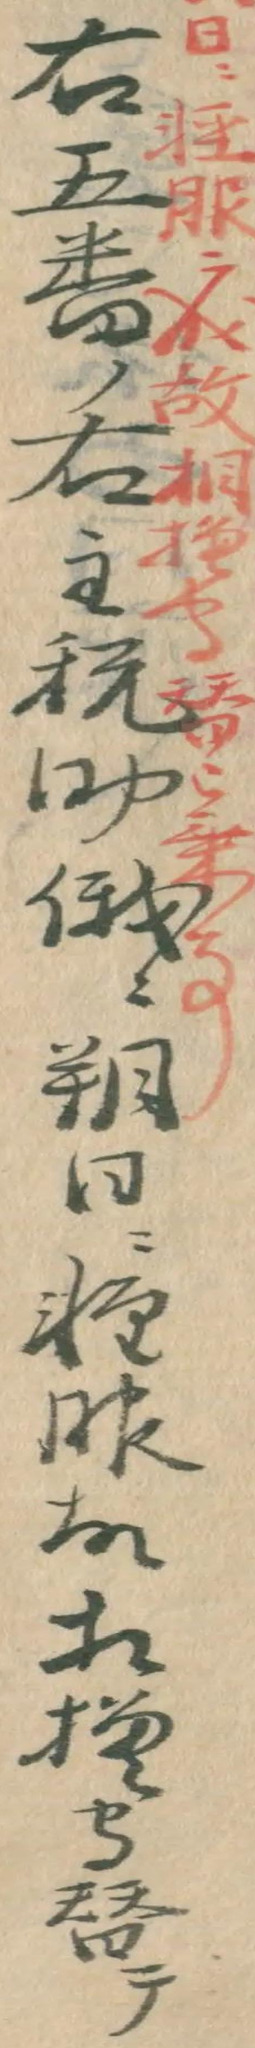右五番ノ右主税助俄ニ朔日ニ軽服故相模守替テ

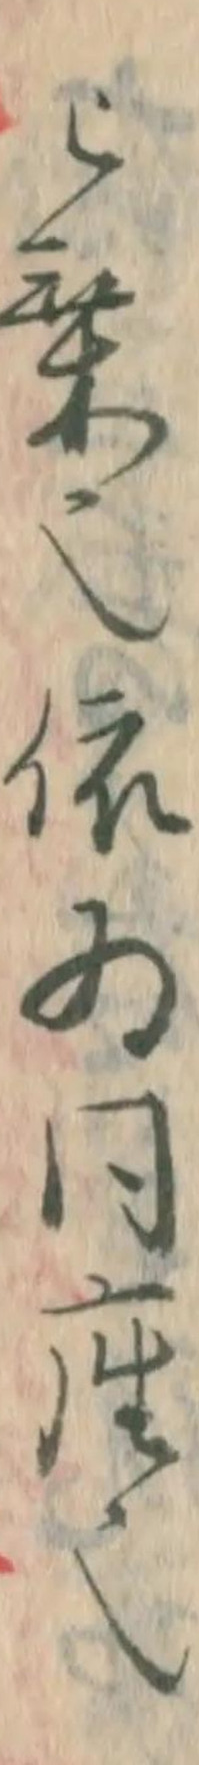被乗也依為同座也
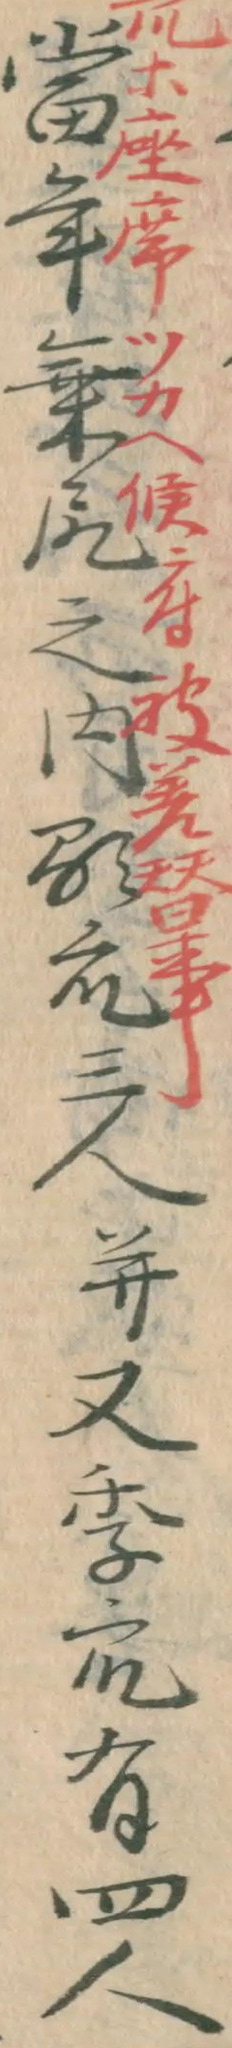当年乗尻之内顕衆三人并又季衆有四人
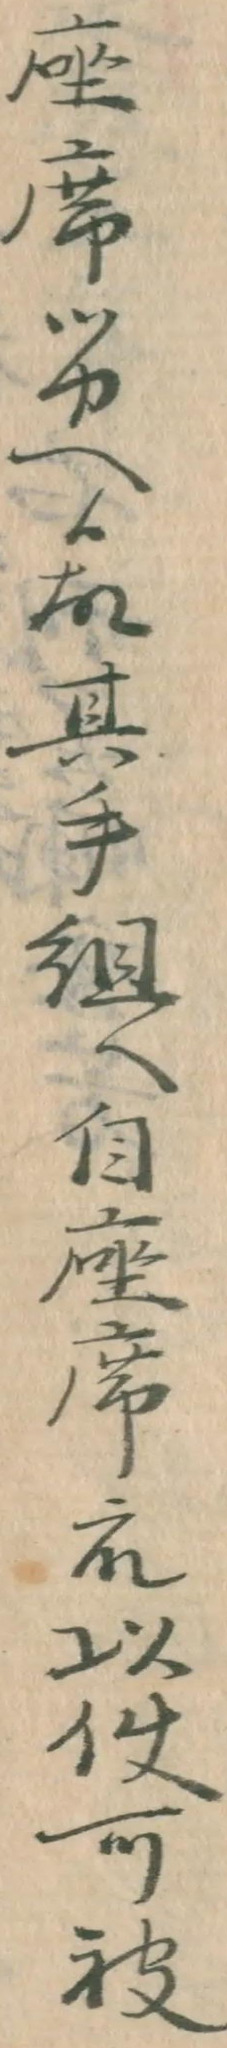座席ツカヘ候故其手組へ自座席衆以使可被
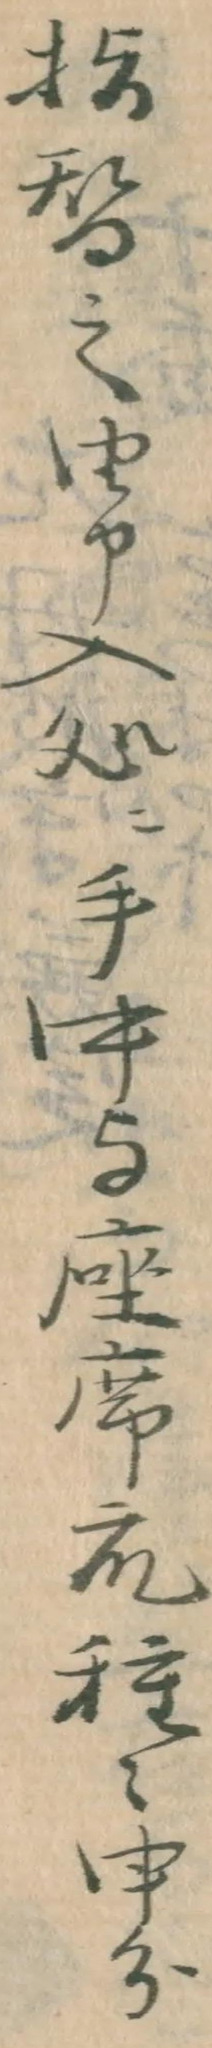指替之由申入処ニ手中与座席衆種々申分
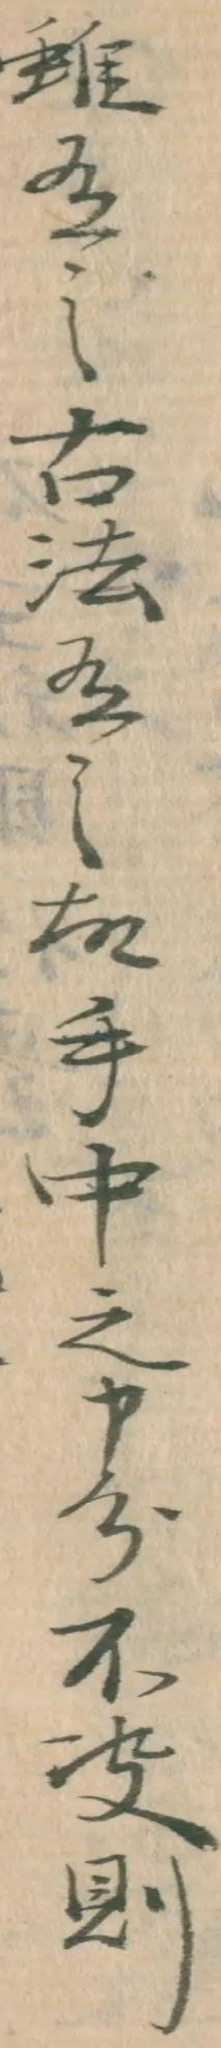雖有之古法有之故手中之申分不決則
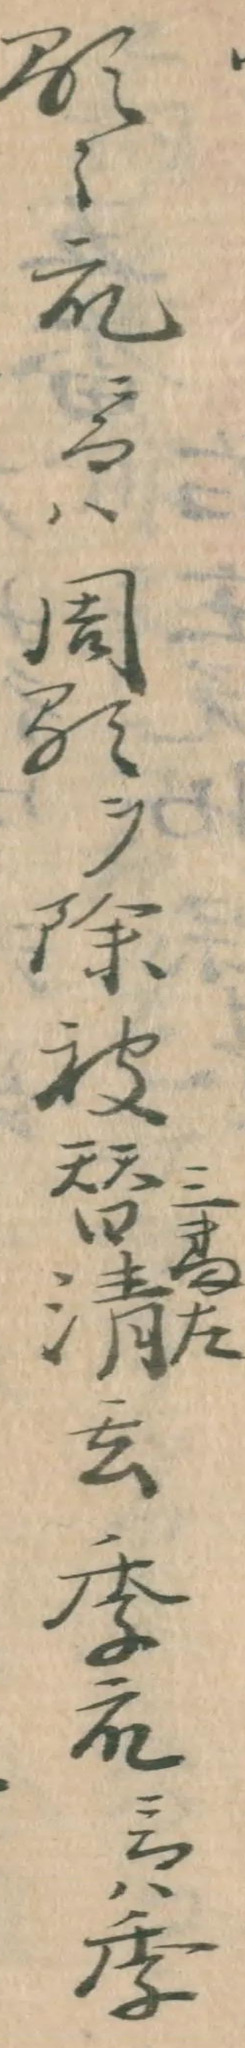顕之衆ニ而ハ周顕ヲ除被替清玄季衆ニ而ハ季
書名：賀茂社記録. 第10冊
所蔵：国立国会図書館 National Diet Library, JAPAN
